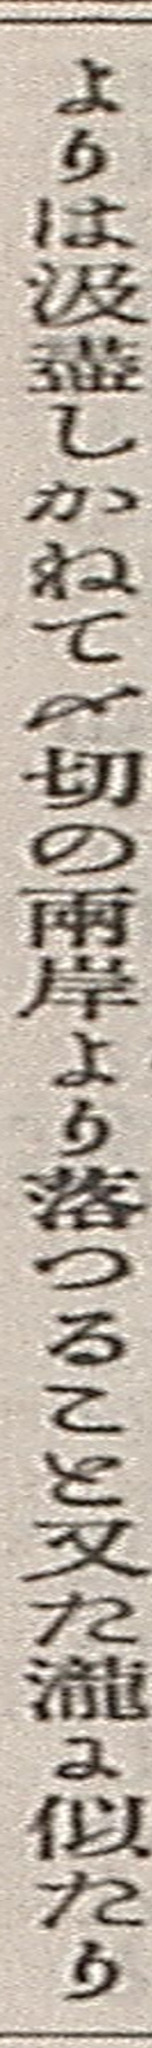よりは吸尽しかねて〆切の両岸より落つること又た瀧に似たり
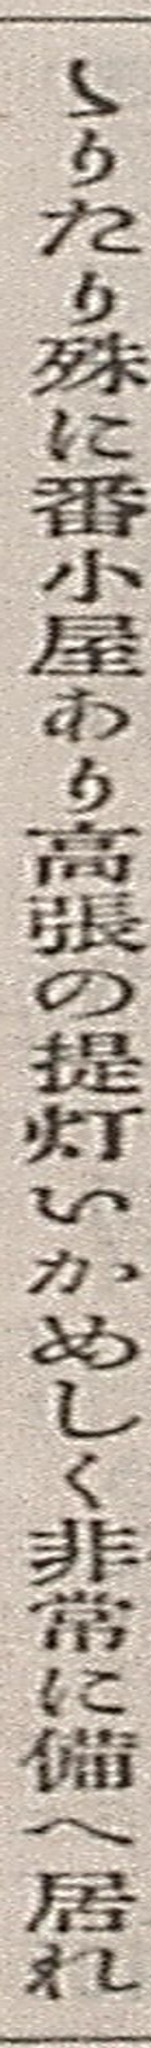ゝりたり殊に番小屋あり高張の提灯いかめしく非常に備へ居れ
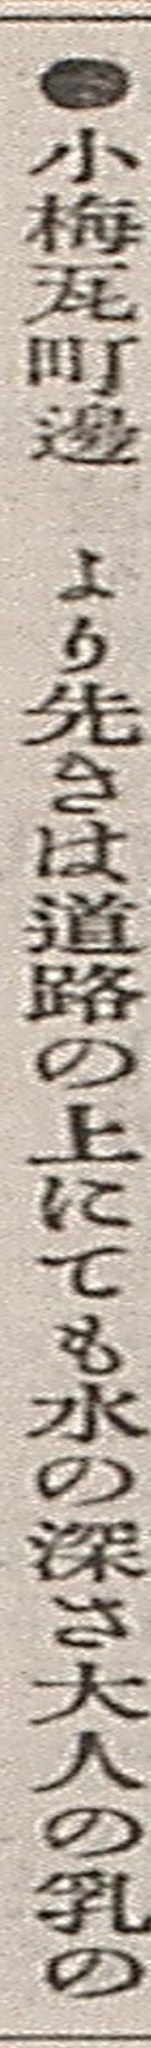●小梅瓦町辺より先きは道路の上にても水の深さ大人の乳の
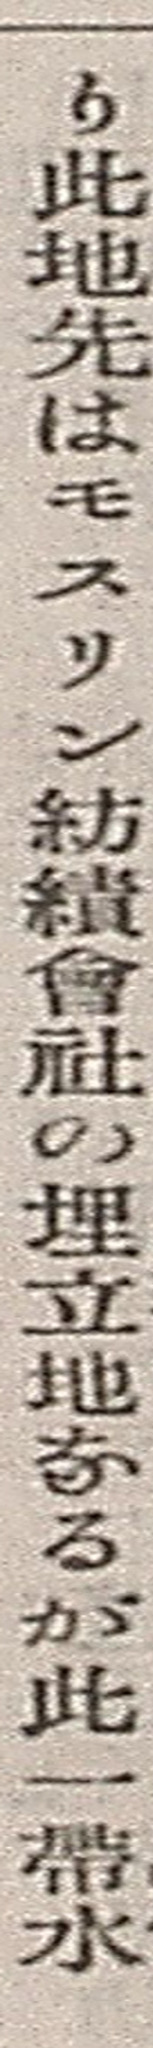り此地先はモスリン紡績会社の埋立地なるが此一帯水
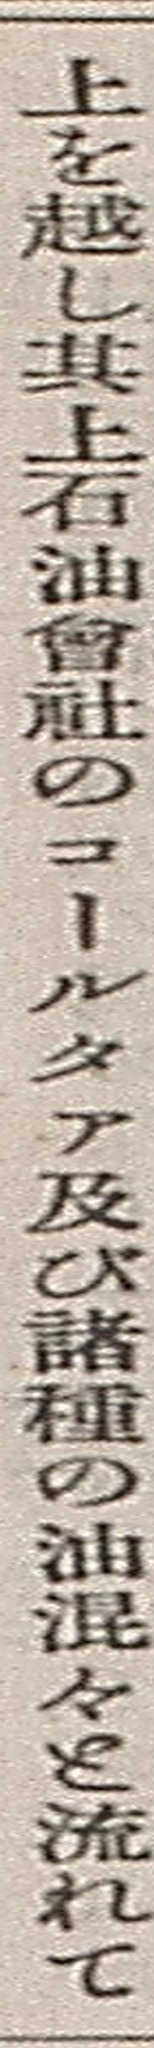上を越し其上石油会社のコールタア及び諸種の油混々と流れて
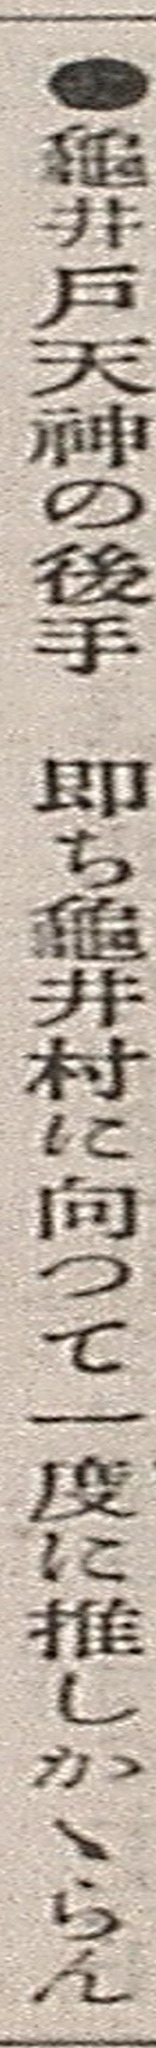●亀井戸天神の後手即ち亀井村に向つて一度に推しかゝらん
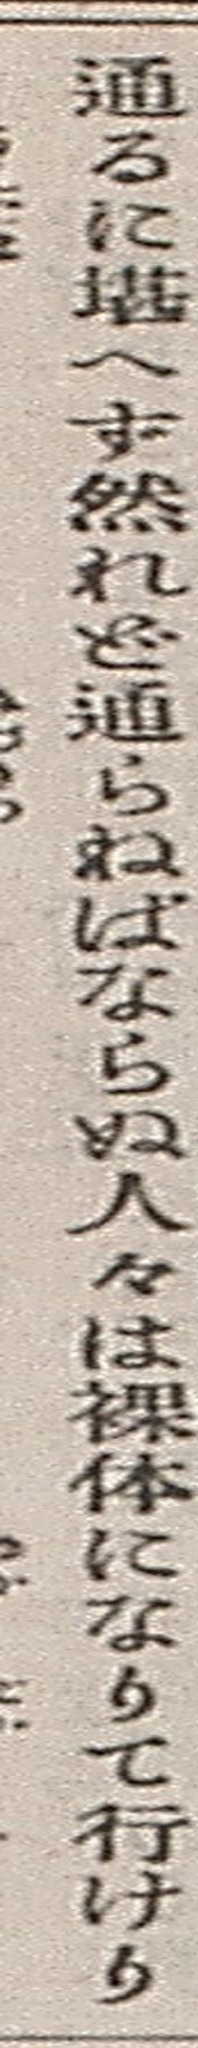通るに堪へず然れど通らねばならぬ人々は裸体になりて行けり
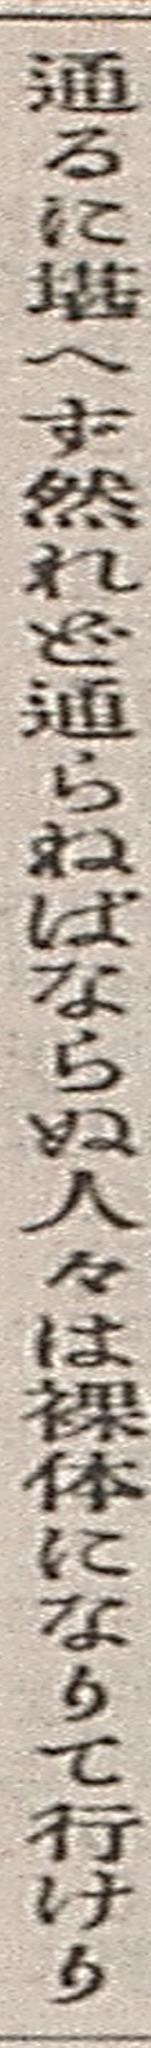通るに堪へず然れど通らねばならぬ人々は裸体になりて行けり
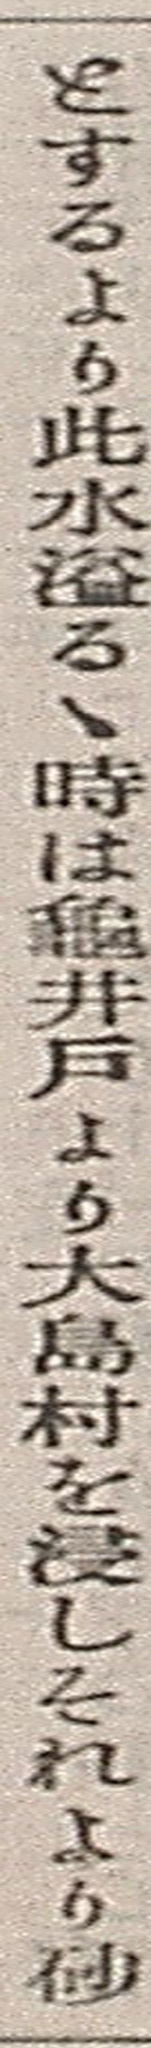とするより此水溢るゝ時は亀井戸より大島村を浸しそれより砂
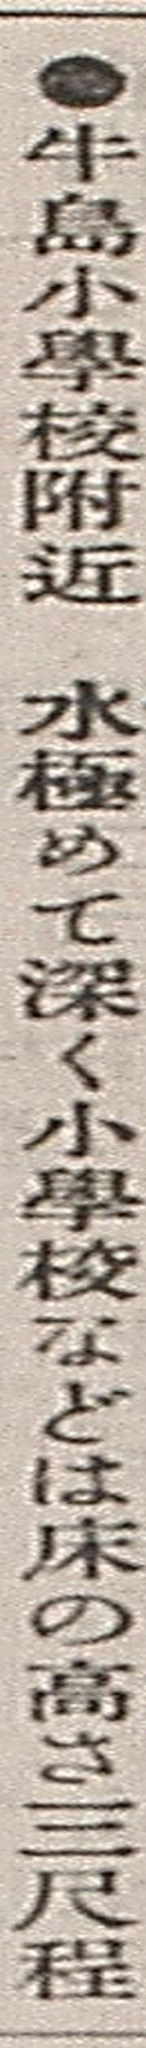●牛島小学校附近水極めて深く小学校などは床の高さ三尺程
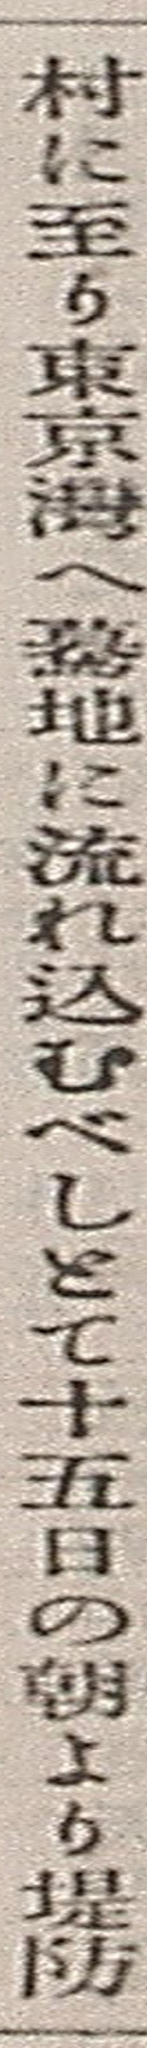村に至り東京湾へ驀地に流れ込むべしとて十五日の朝より堤防
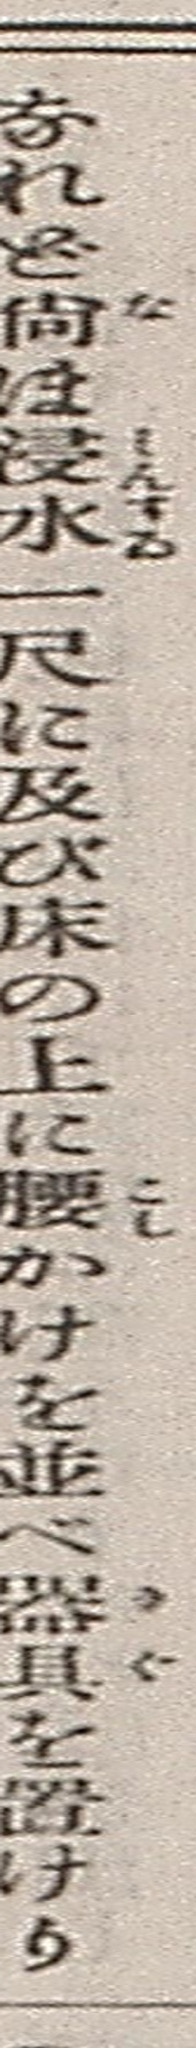なれど尚ほ浸水一尺に及び床の上に腰かけを並べ器具を置けり
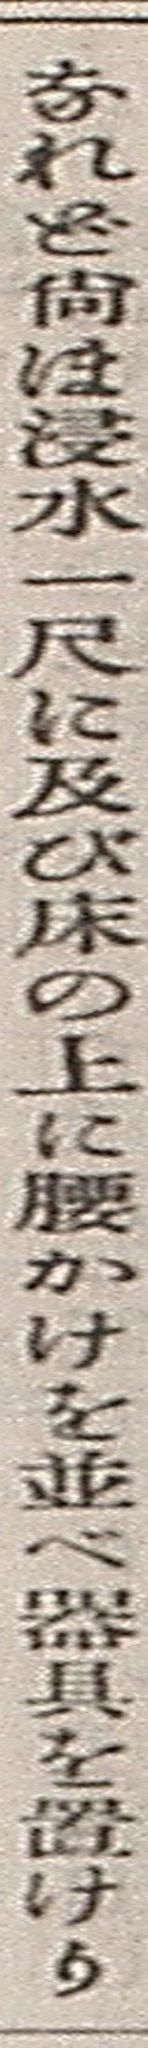なれど尚ほ浸水一尺に及び床の上に腰かけを並べ器具を置けり
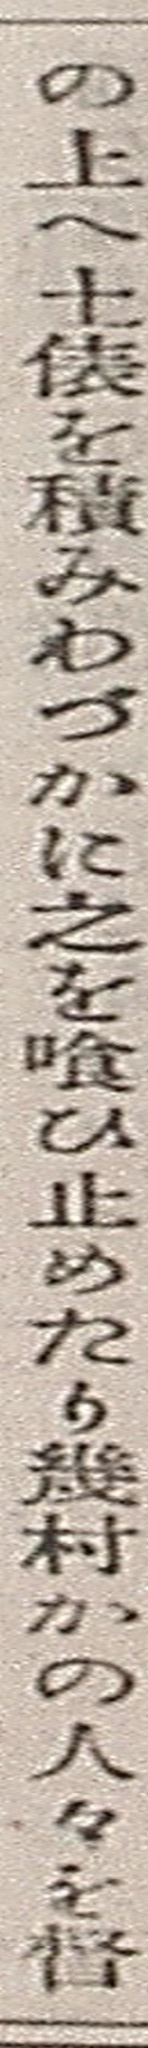の上へ土俵を積みわづかに之を喰ひ止めたり幾村かの人々を督
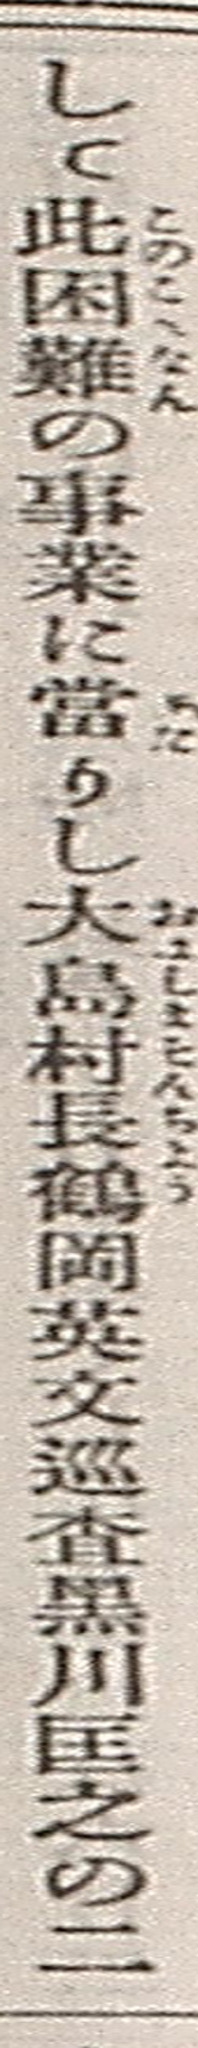して此困難の事業に当りし大島村長鶴岡英文巡査黒川匡之の二
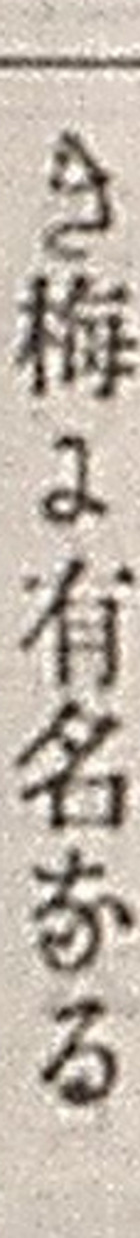き梅に有名なる
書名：風俗畫報臨時増刊第百二十四號　洪水地震被害録（上）
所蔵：東京大学地震研究所図書室 Earthquake Research Institute Library, The University of Tokyo, JAPAN
